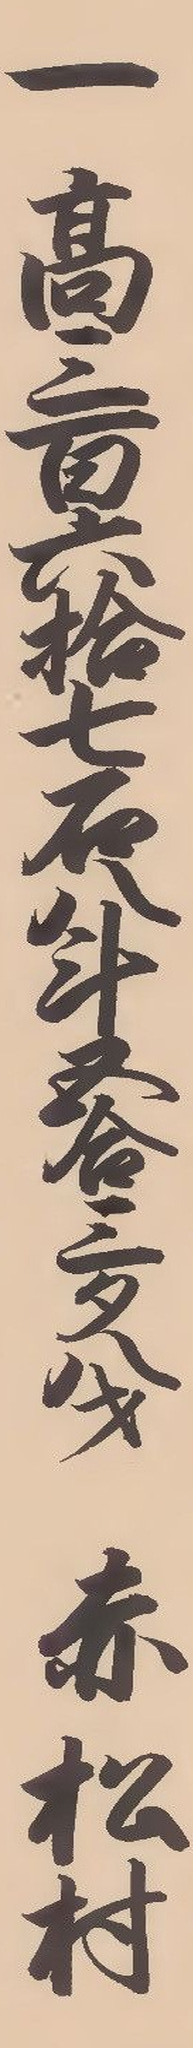一高三百六拾七石八斗五合三勺八才赤松村
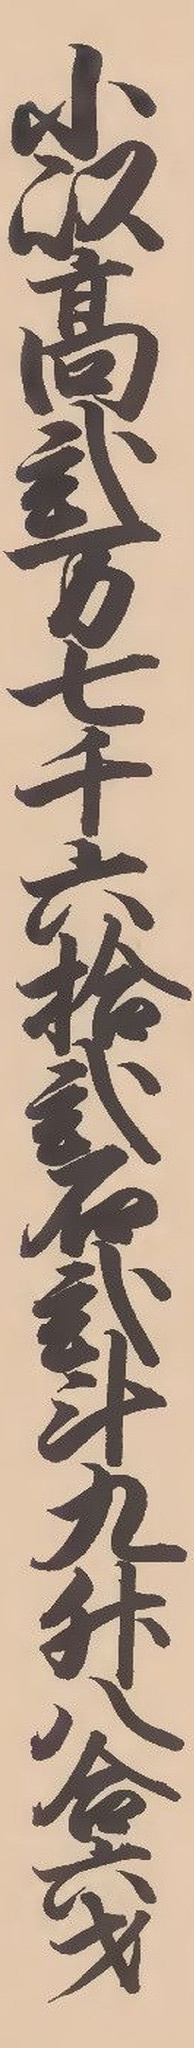小以高弐万七千六拾弐石弐斗九升八合六才

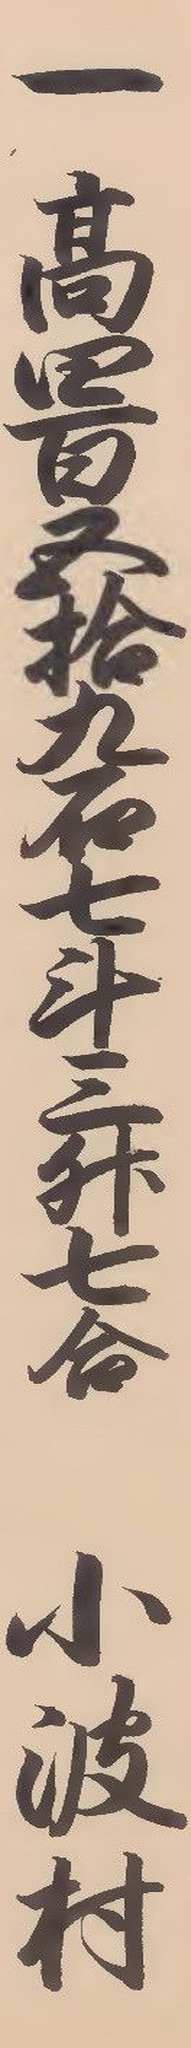一高四百五拾九石七斗三升七合小波村
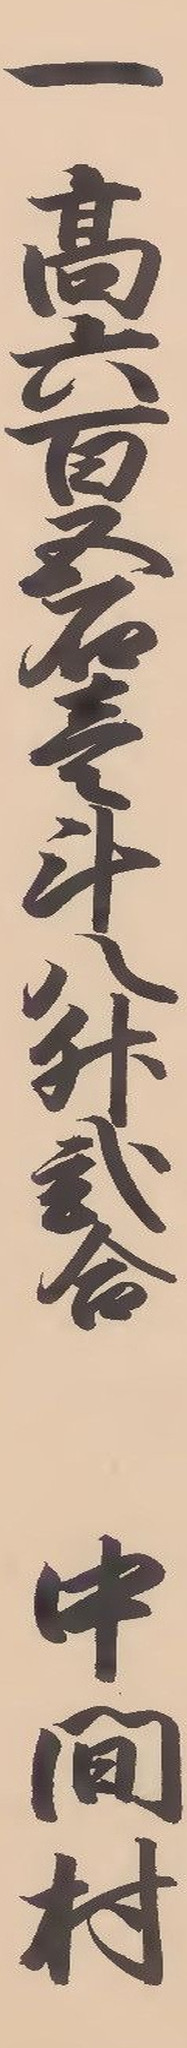一高六百五石壱斗八升弐合中間村

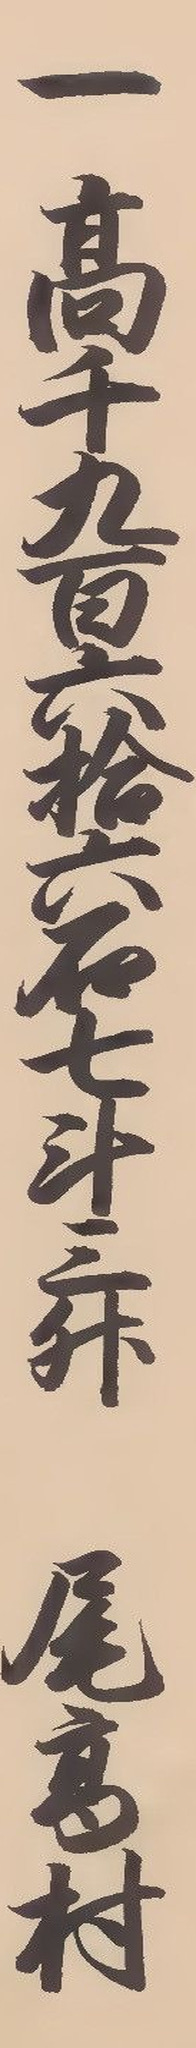一高千九百六拾六石七斗三升尾高村
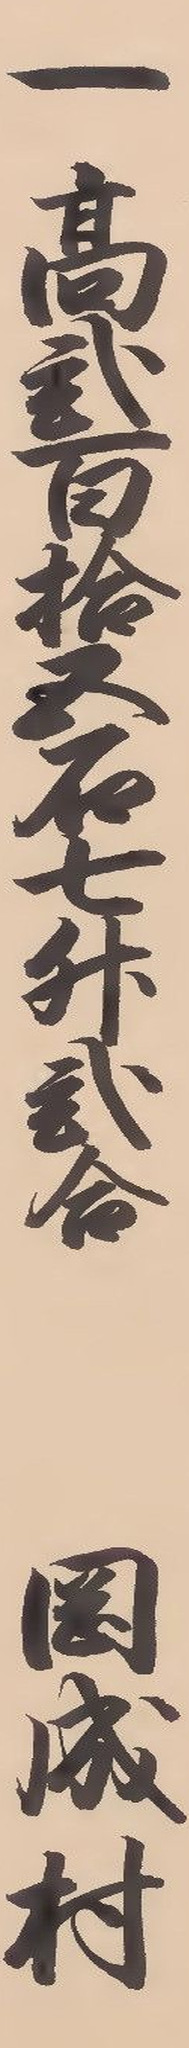一高弐百拾五石七升弐合岡成村
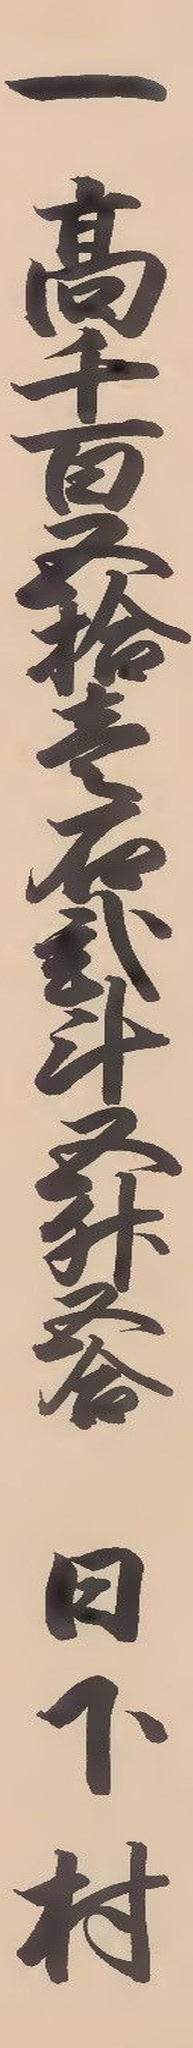一高千百五拾壱石弐斗五升五合日下村
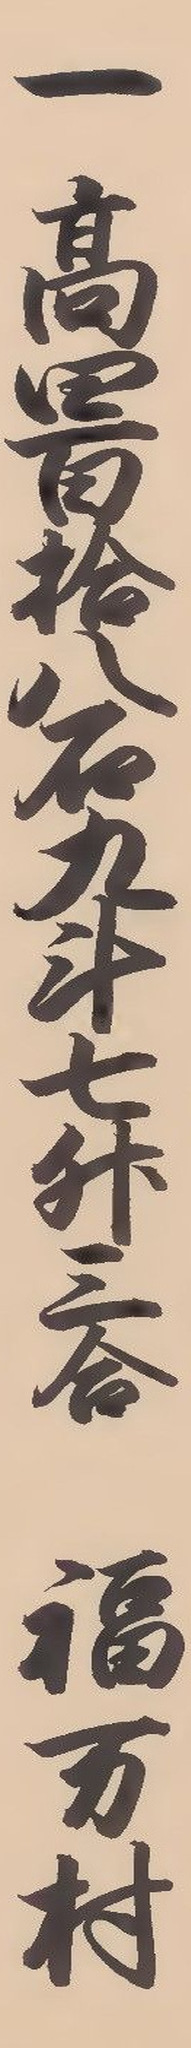一高四百拾八石九斗七升三合福万村
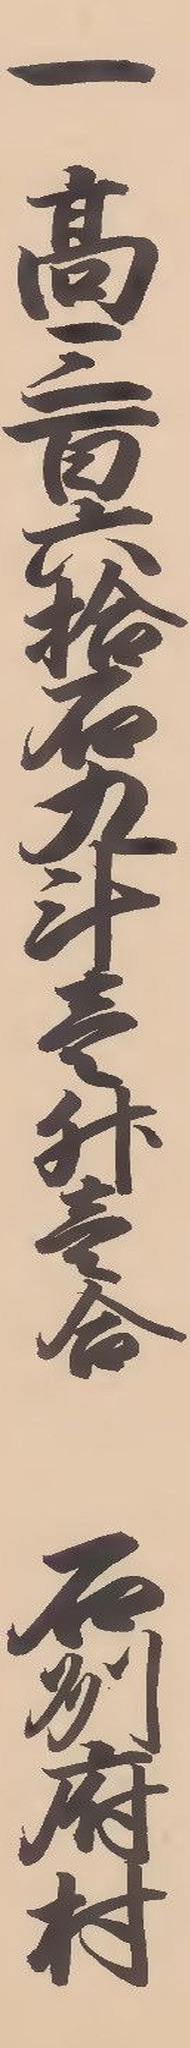一高三百六拾石九斗壱升壱合石州府村

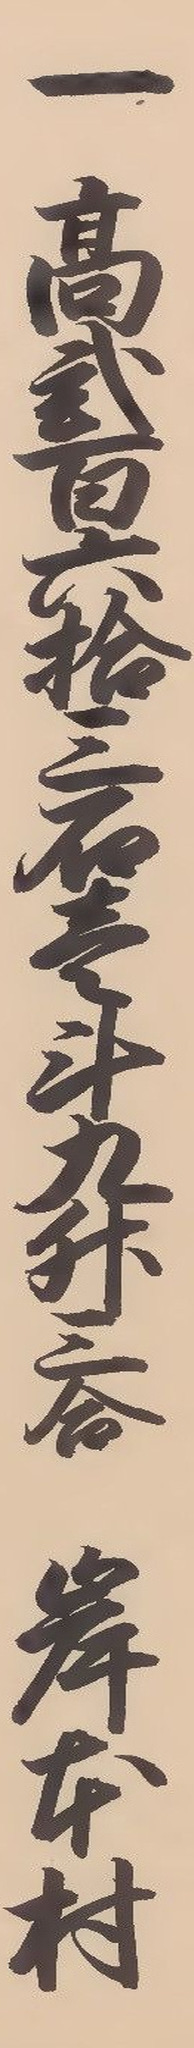一高弐百六拾三石壱斗九升三合岸本村
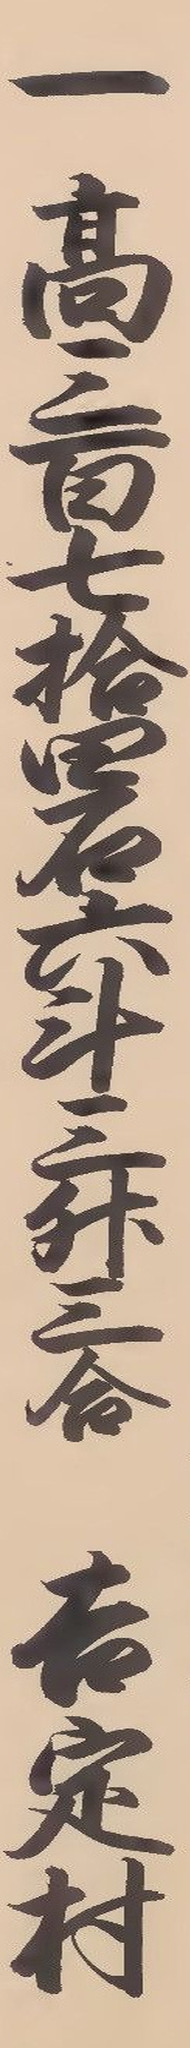一高弐百拾四石五斗三升三合高田村
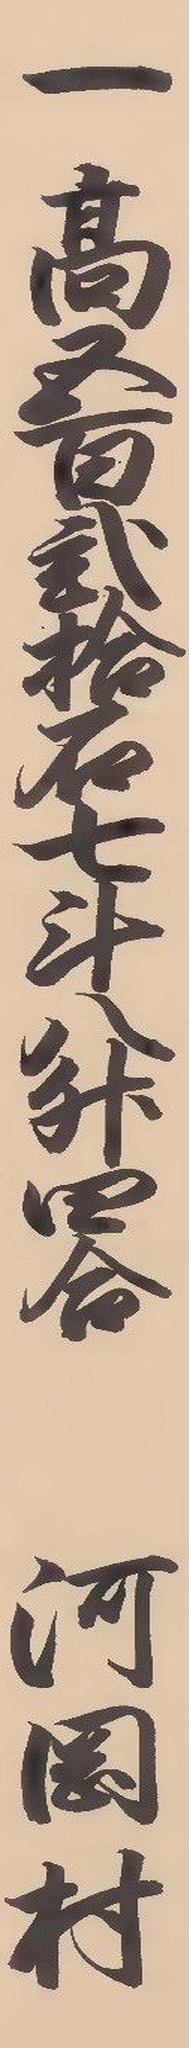一高五百弐拾石七斗八升四合河岡村
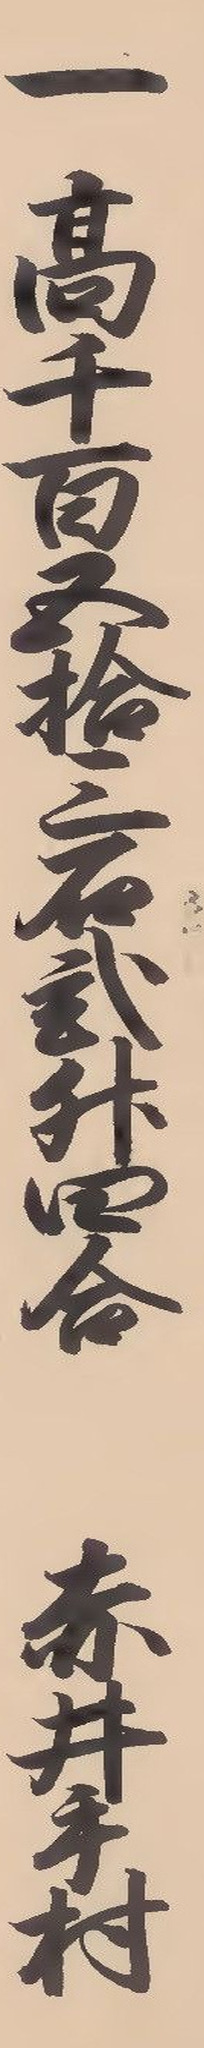一高千百五拾三石弐升四合赤井手村
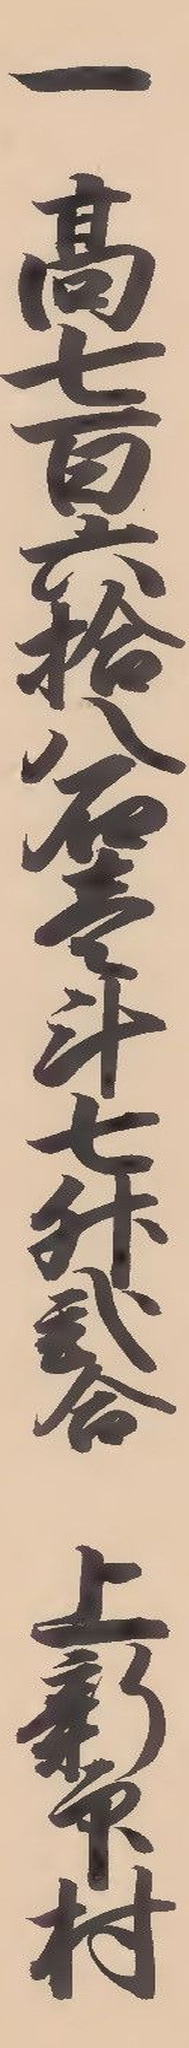一高七百六拾八石壱斗七升弐合上新印村
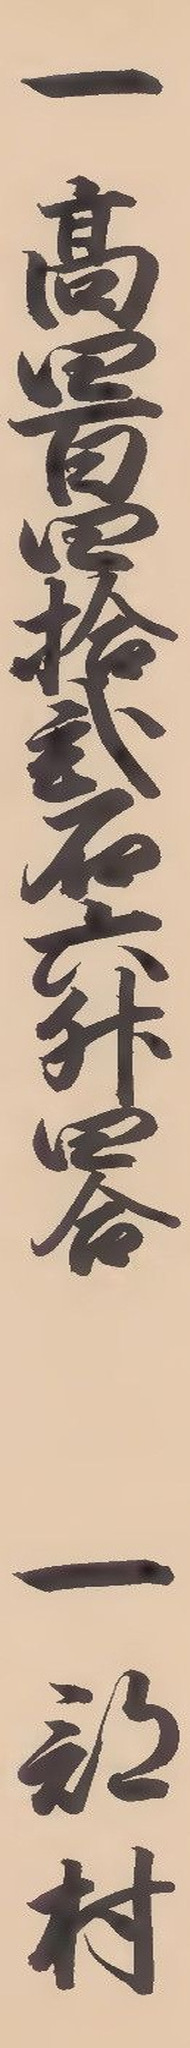一高四百四拾弐石六升四合一部村
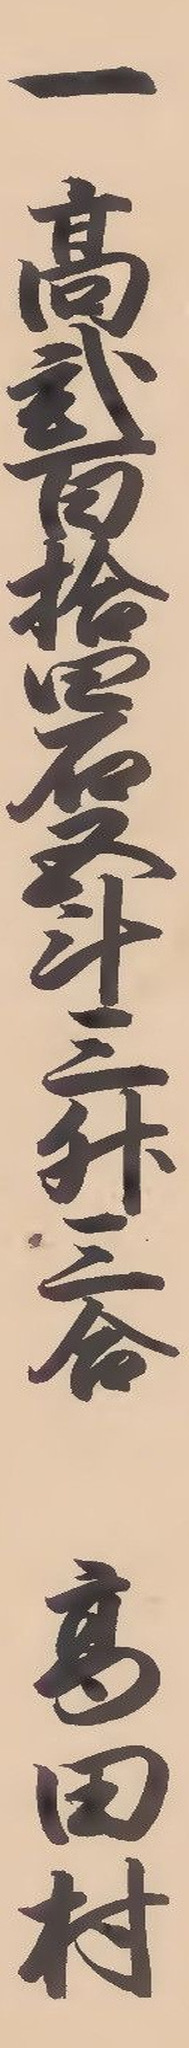一高弐百拾四石五斗三升三合高田村
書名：伯耆国郷帳
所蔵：国立公文書館 National Archives of Japan
